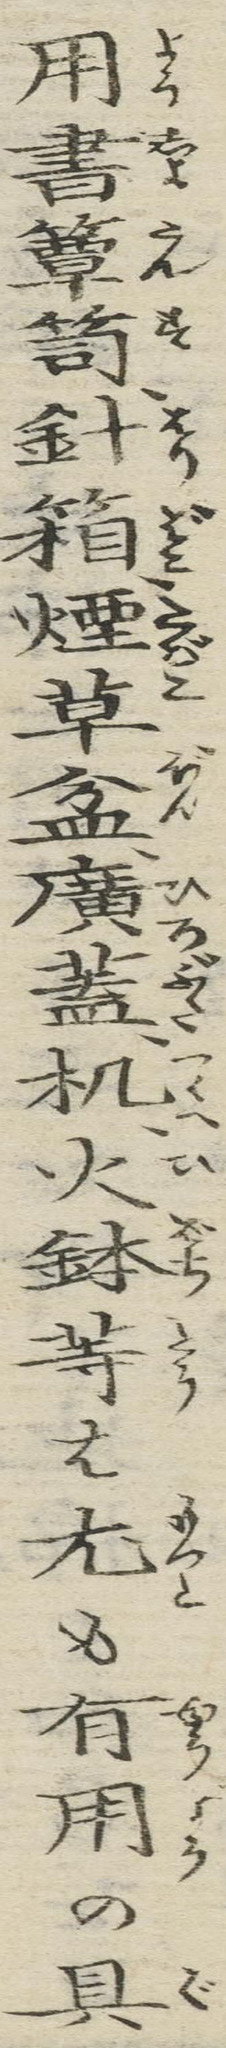用書箪笥、針箱、煙草盆、広蓋、机、火鉢等は尤も有用の具
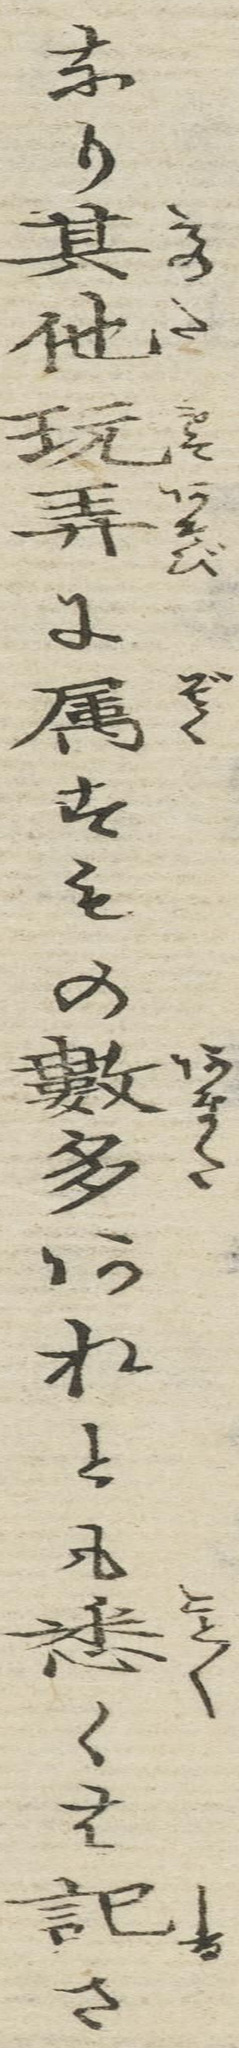なり其他玩弄に属すもの数多あれとも悉くは記さ
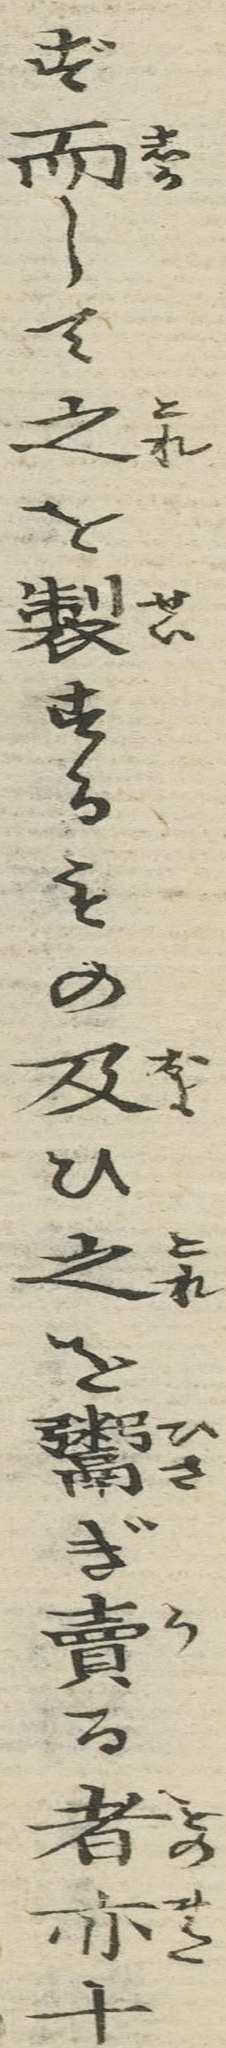ず而して之を製するもの及ひ之を鬻ぎ売る者亦十
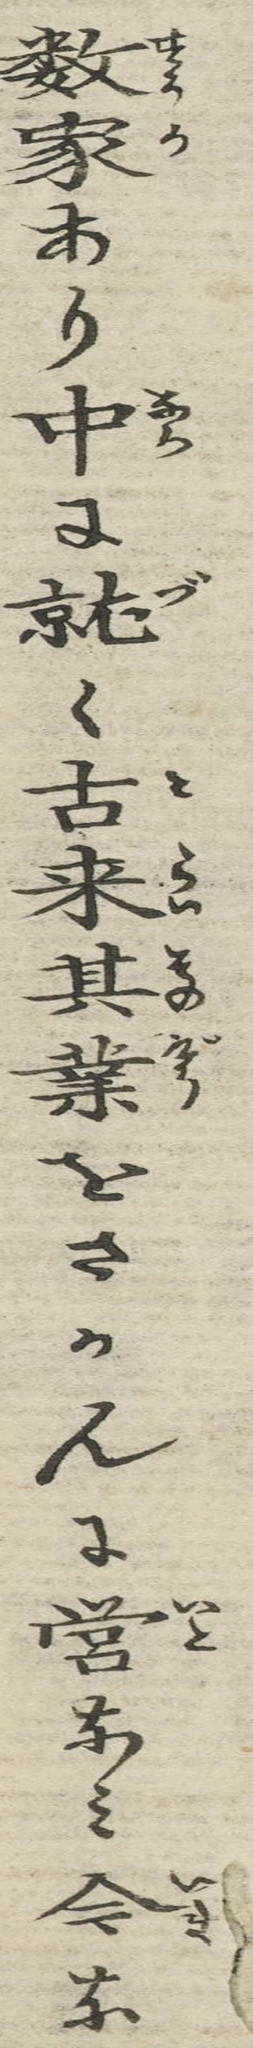数家あり中に就く古来其業をさかんに営なみ今な
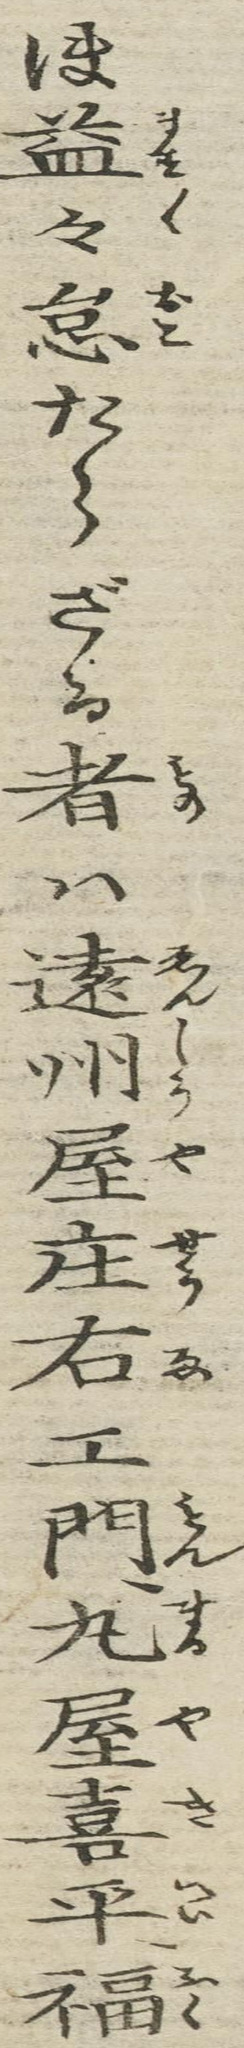ほ益々怠たらざる者は遠州屋庄右衛門、丸屋喜平、福

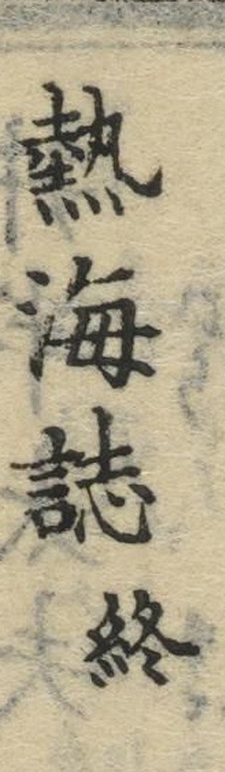熱海誌終
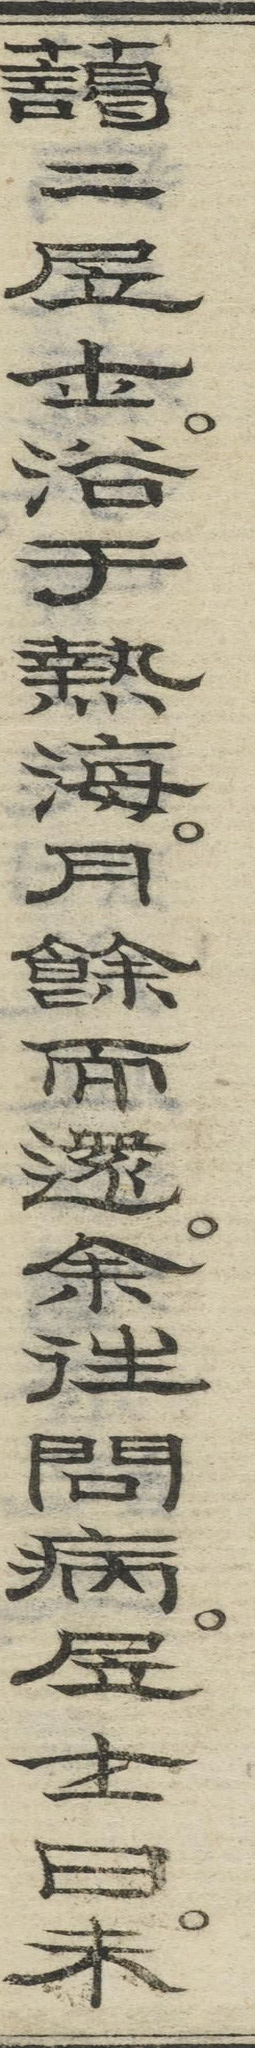藹々居士。浴于熱海。月余而還。余注問病。居士曰。未
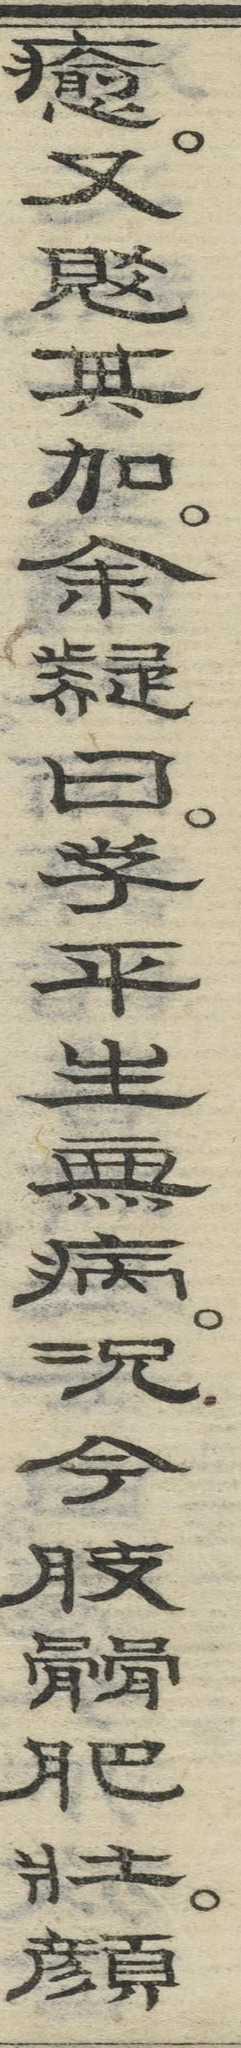癒。又覐其加。余疑曰。学平生無病。况今肢体肥壮。顔
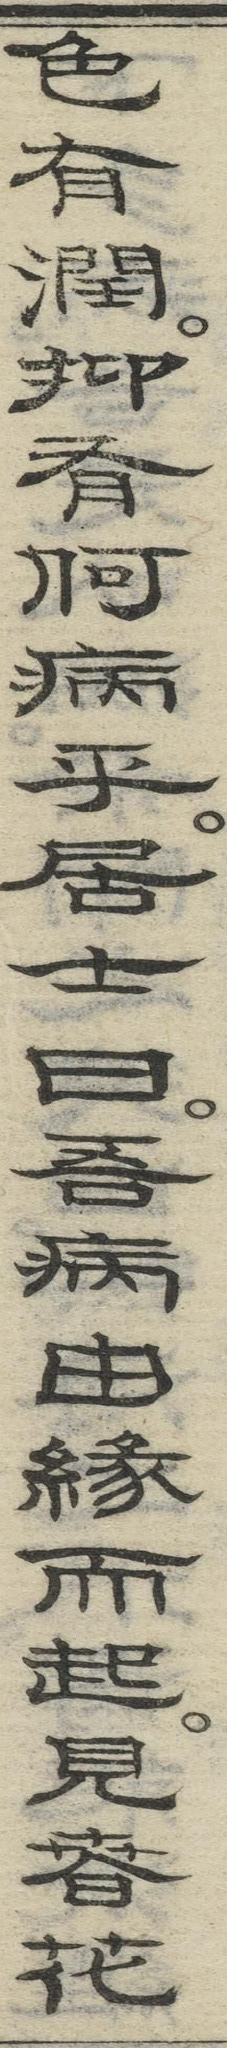色有潤。抑有何病乎。居士曰。吾病由縁而起。見春花
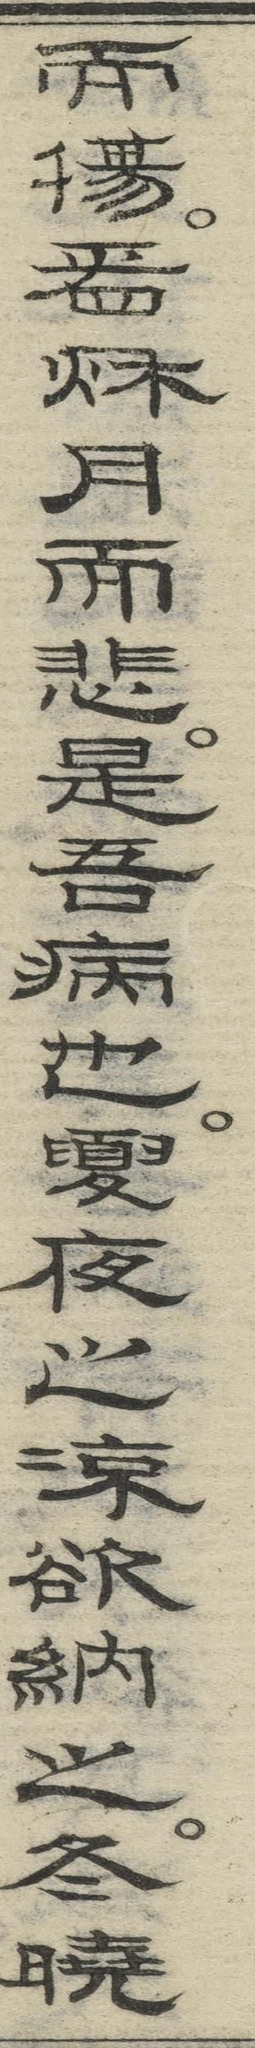而傷。番炑月而悲。是吾病也。夏夜之涼欲納之。冬暁
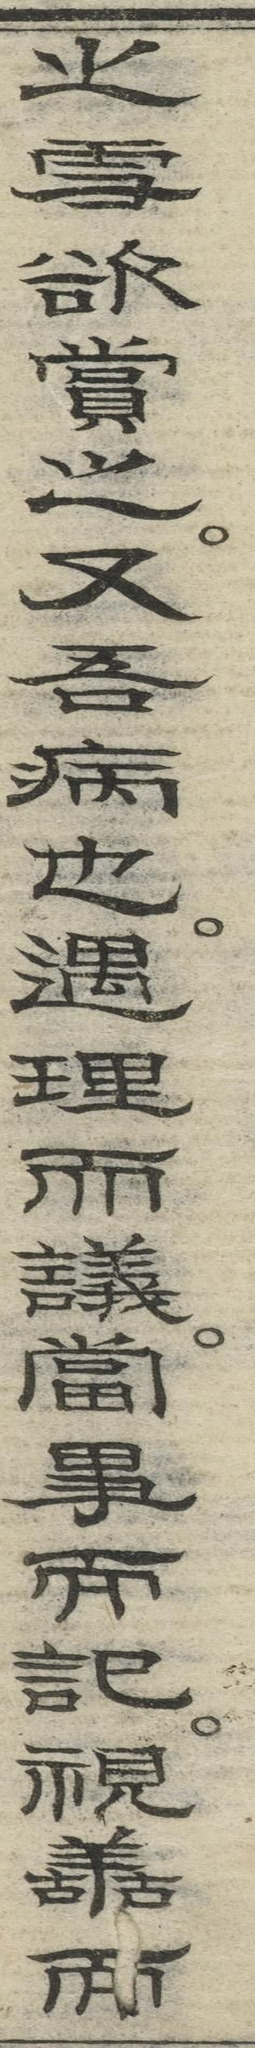之雪欲賞之。又吾病也。偶理而議。当事而記。視善而
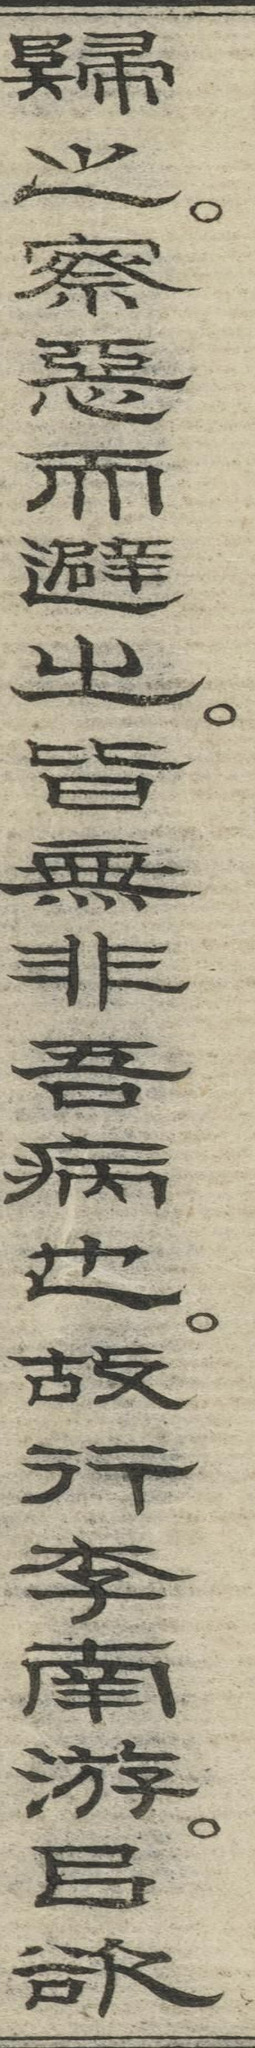帰之。察悪而避出。皆悪非吾病也。故行李南游。以欲

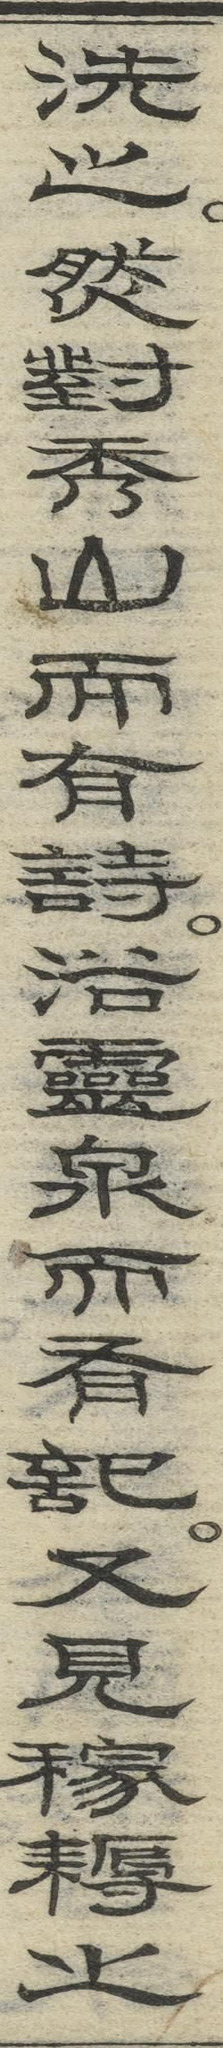洗之。然対秀山而有詩。浴霊泉而有記。又見稼耨之
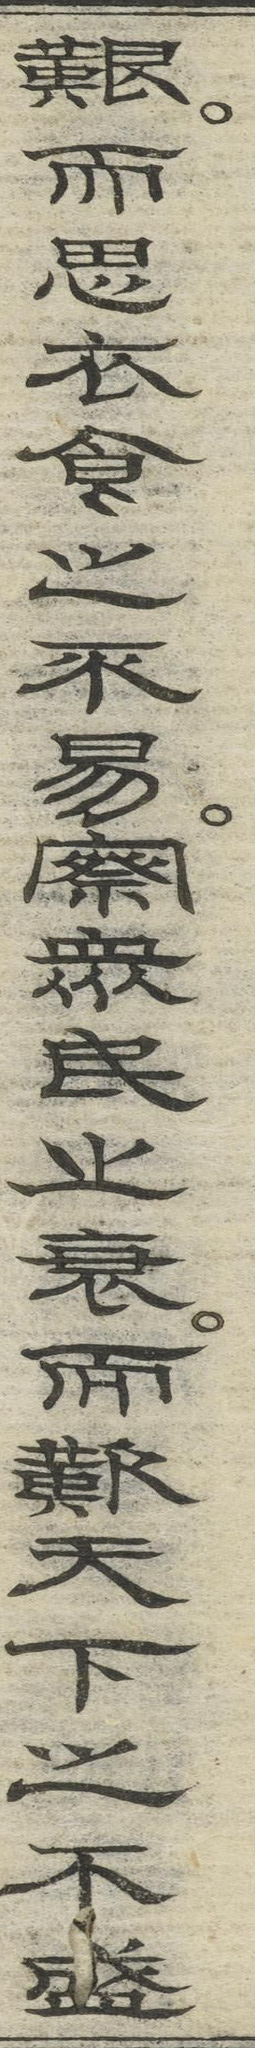艱。而思衣食之不易。察衆民之衰。而艱天下之不盛
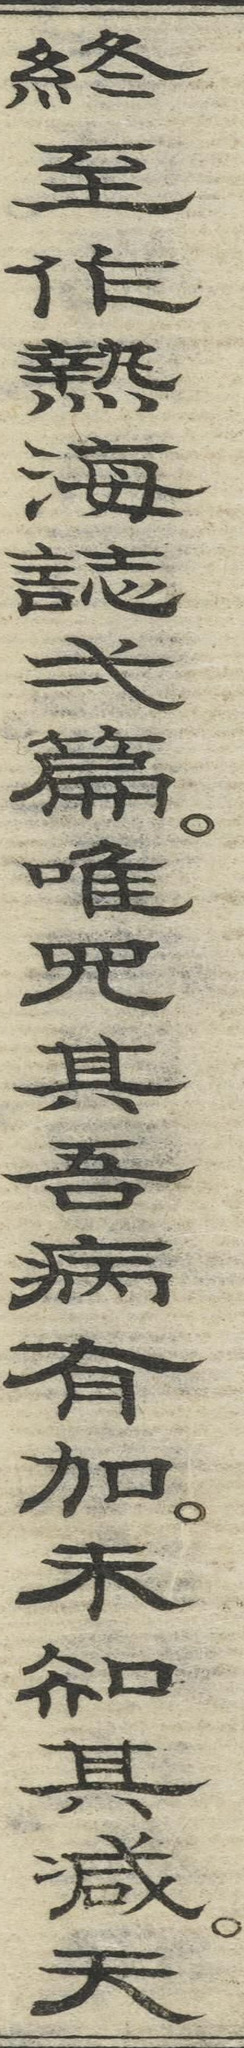終至作熱海誌弌篇。唯兕？其吾病有加。未欲其減。天
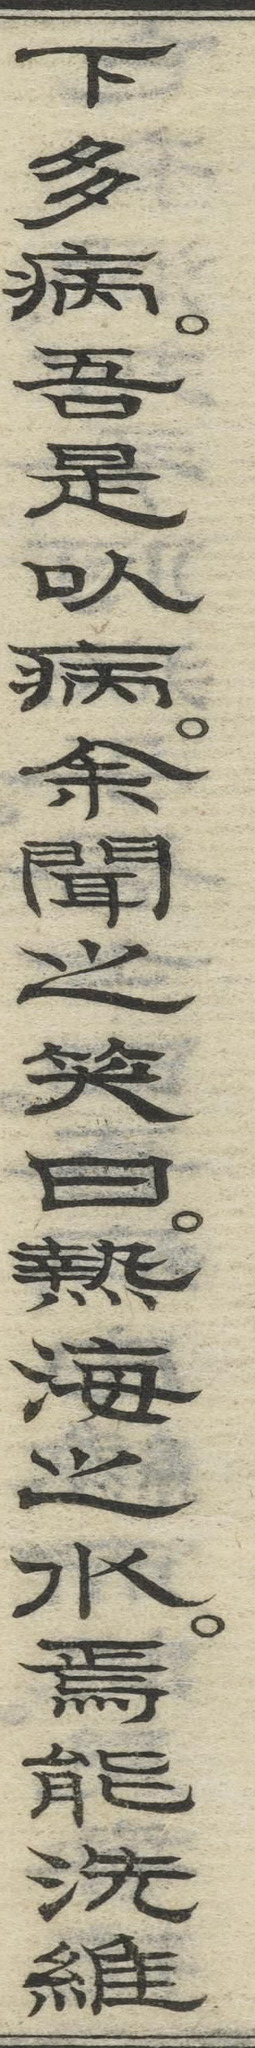下多病。吾是臥？病。余聞く之笑曰。熱海之水。焉能洗維
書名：豆州熱海誌　完
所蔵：東京大学地震研究所図書室 Earthquake Research Institute Library, The University of Tokyo, JAPAN
